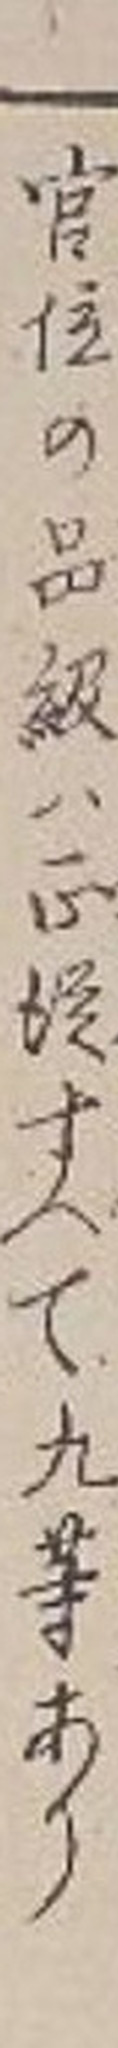官位の品級は正従すべて九等あり
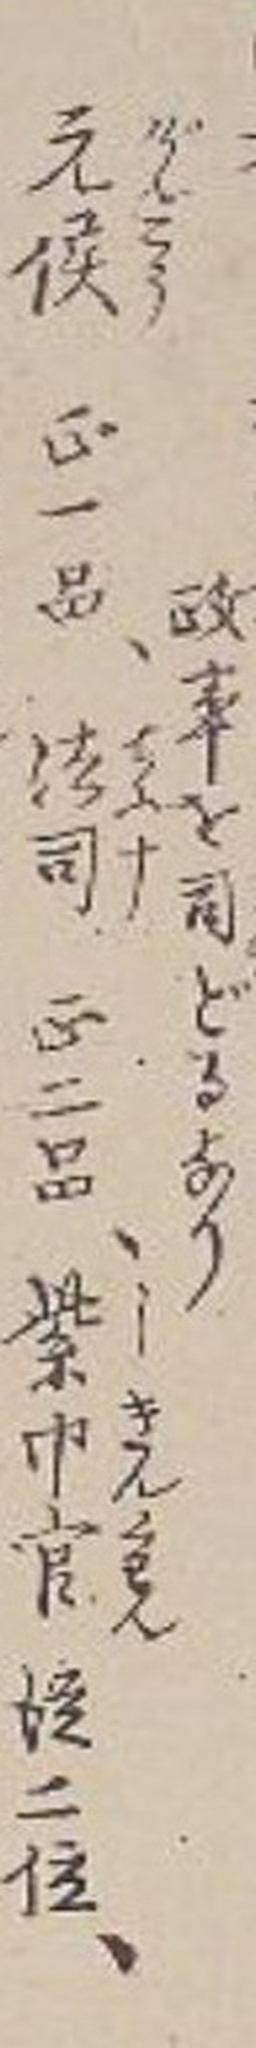元侯正一品、法司正二品、紫巾官従二位、

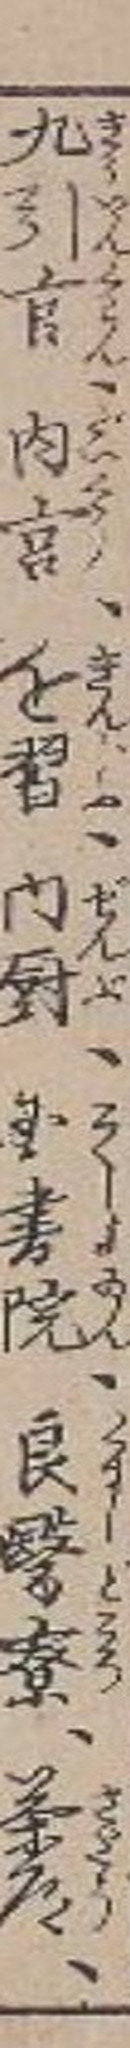九引官、内官、近習、内厨、国書院、良医寮、茶道、
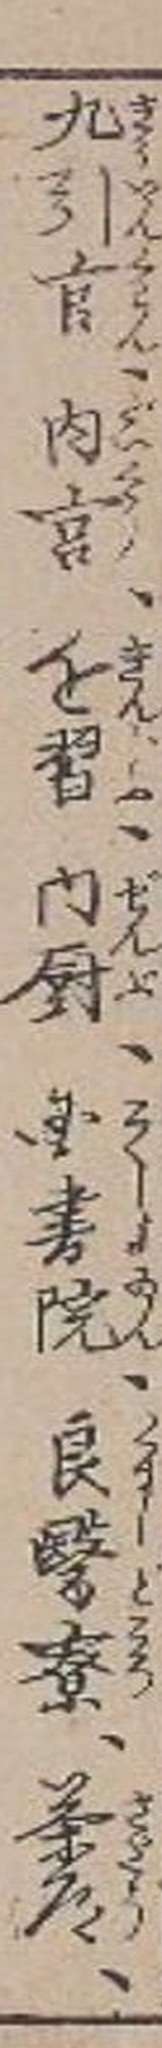九引官、内官、近習、内厨、国書院、良医寮、茶道、
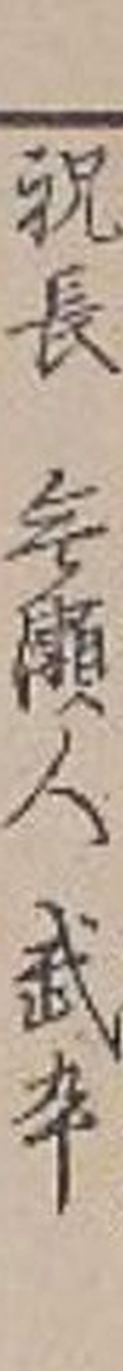祝長、無瀬人、武卒、
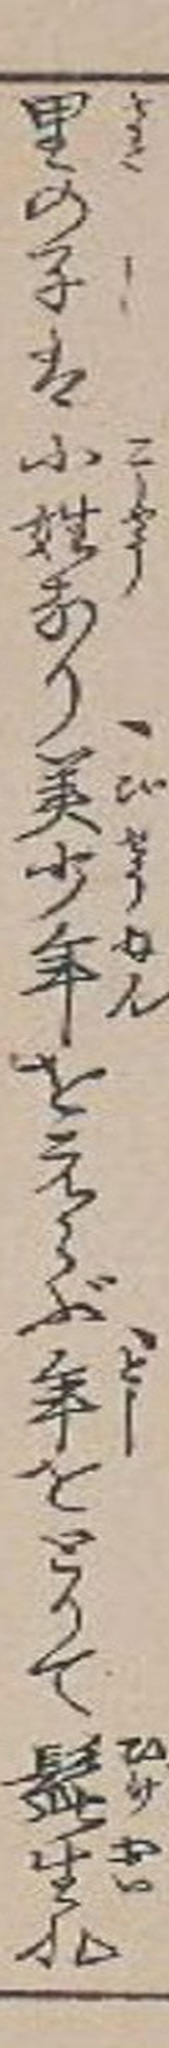里の子は小姓なり、美少年をえらぶ、年をとりて髭生れ
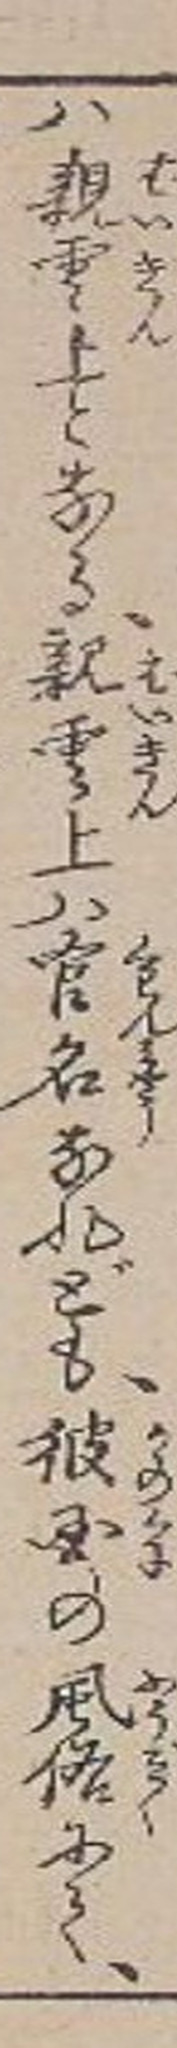は親雲上となる、親雲上は官名なれども、彼国の風俗にて、
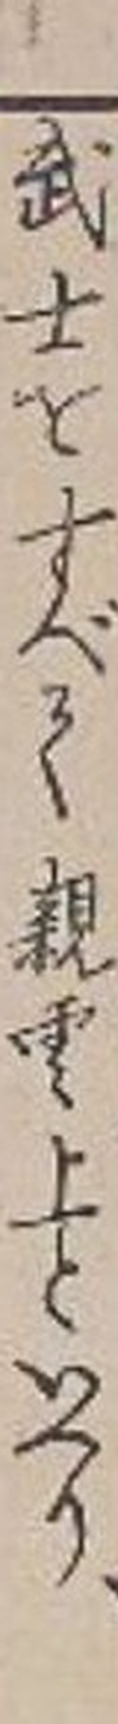武士をすべて親雲上といへり、
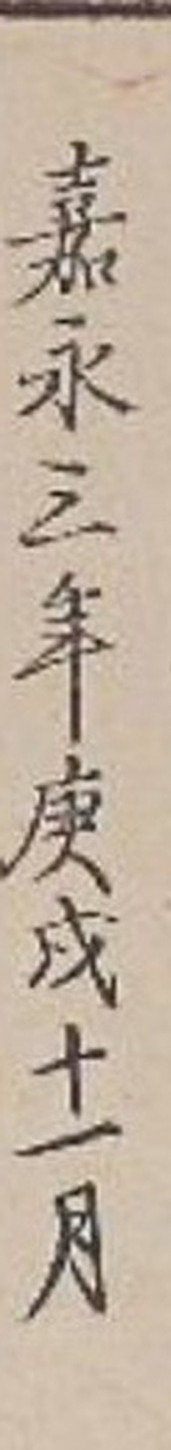嘉永三年庚戌十一月
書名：琉球入貢紀略
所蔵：University of the Ryukyus Library
